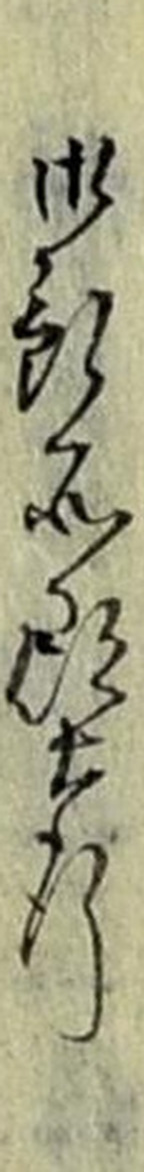御預所郡奉行
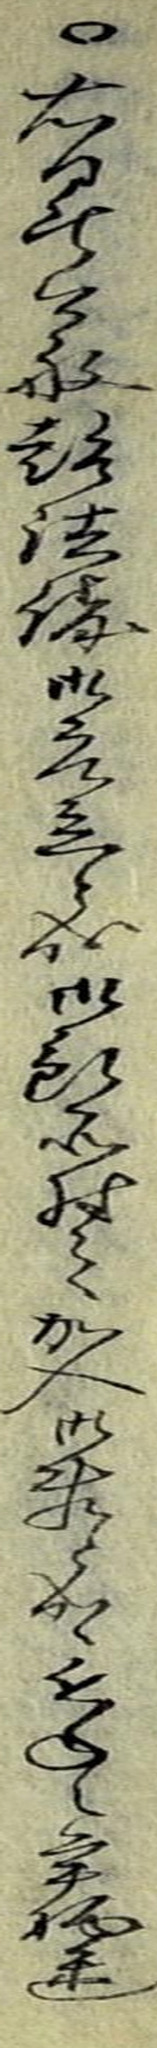○右同断今般趣法講御取立被成御預所村々へ加入御頼被成候近年之年柄迷
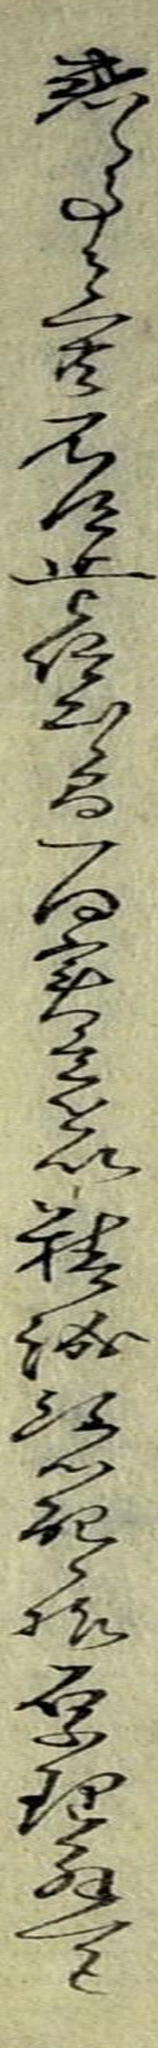惑之事に候へ共不得止被仰出候間一同実意を以精誠致心配候様厚理解可被
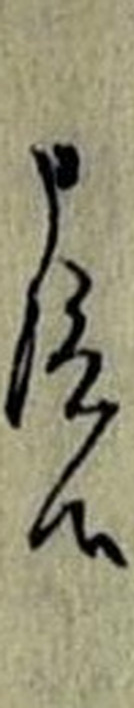申渡候
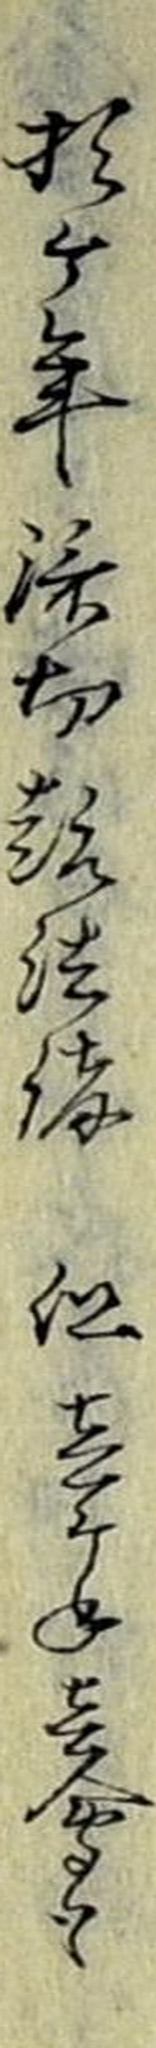拾ヶ年済切趣法講但壱ヶ年壱会つヽ
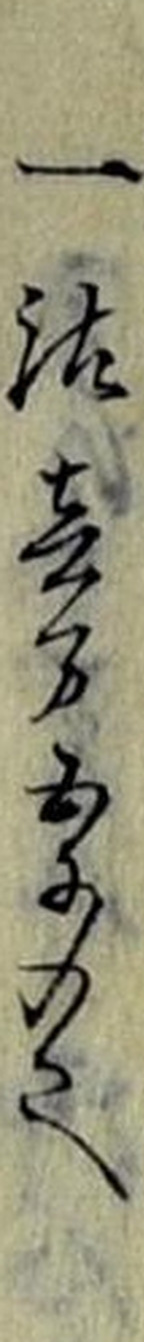一銀壱万五千貫匁
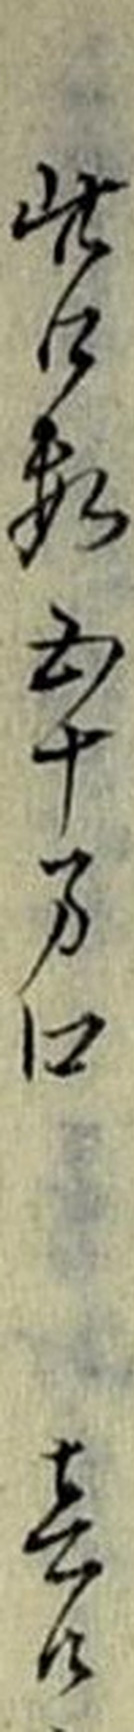此口数四十万口同断
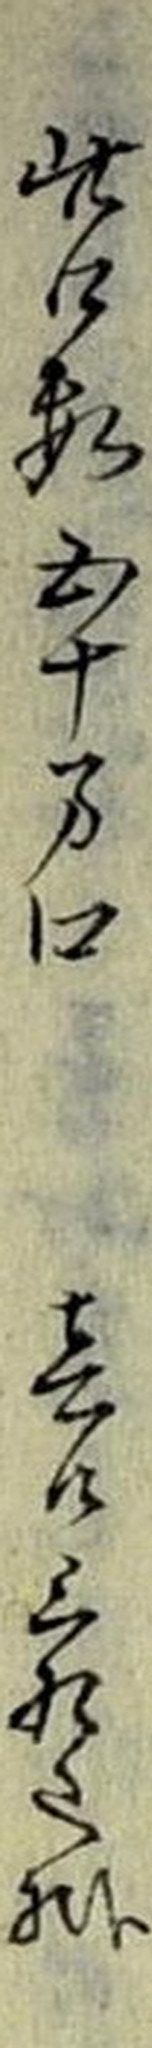此口数五十万口壱口三拾匁掛
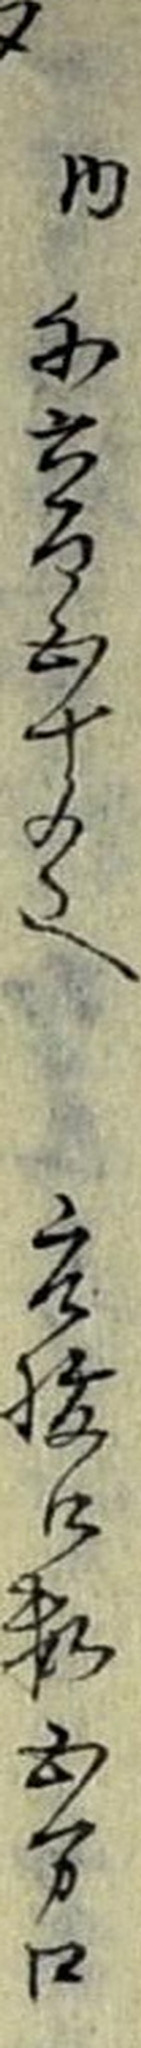内千六百五十貫匁取扱口数五万口
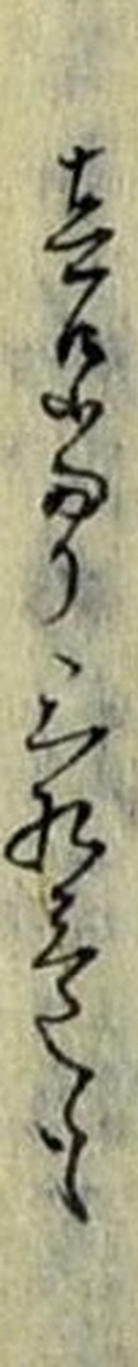壱口当り三拾壱匁つヽ
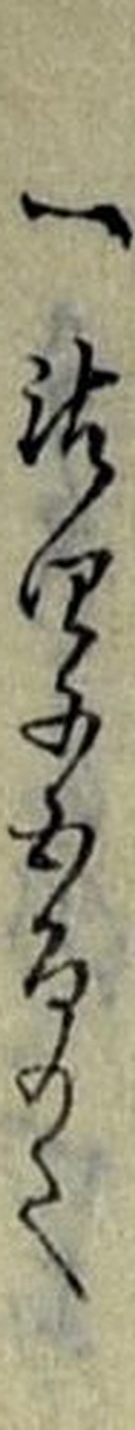一銀四千五百貫匁
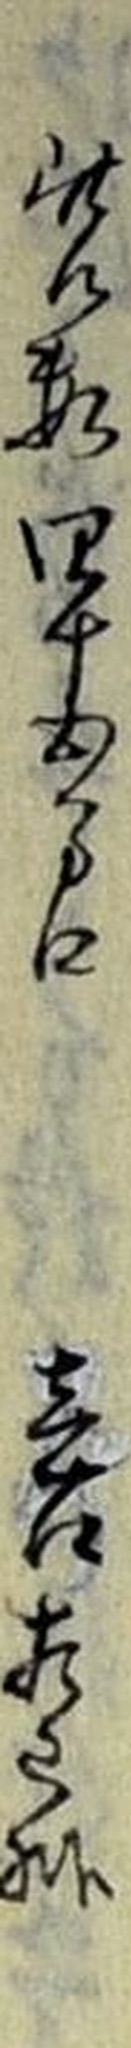此口数四十五万口壱口拾匁掛
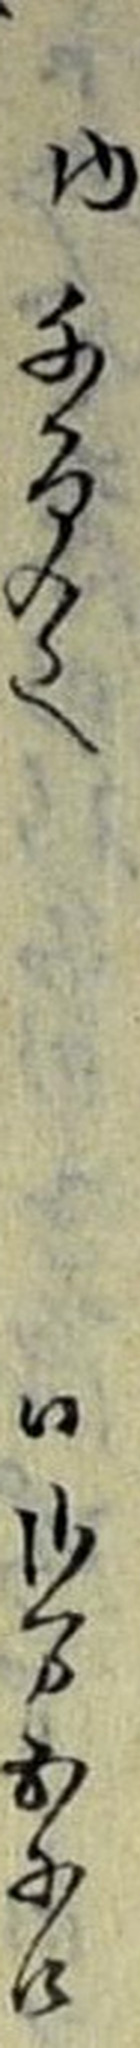内千百貫匁同弐万五千口
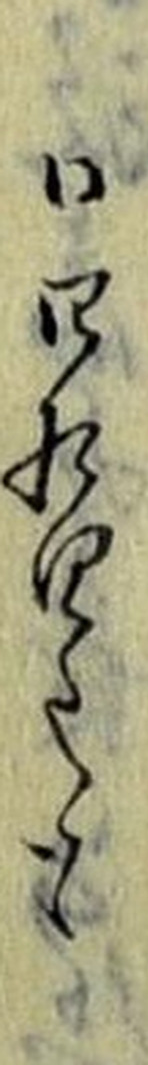同四拾四匁つヽ
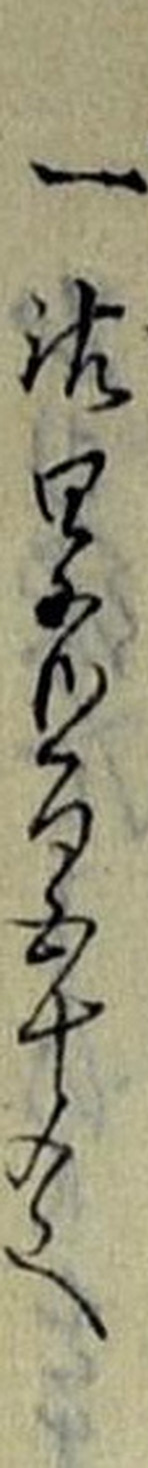一銀四千弐百五十貫匁
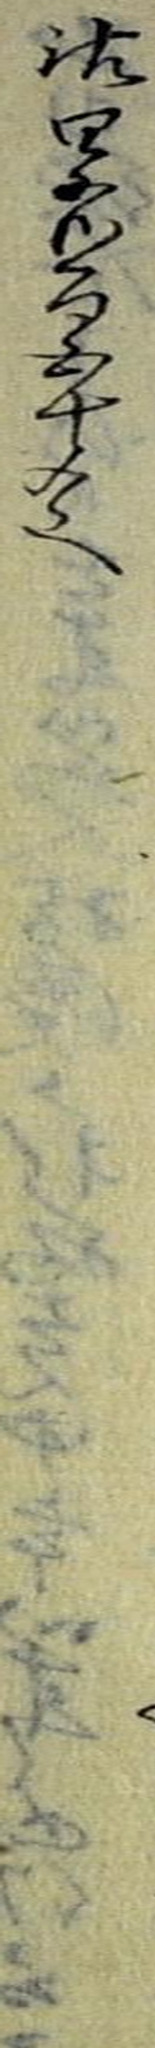一銀四千弐百五十貫匁
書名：命令之部 六
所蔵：福井県文書館 Fukui Prefectural Archives
